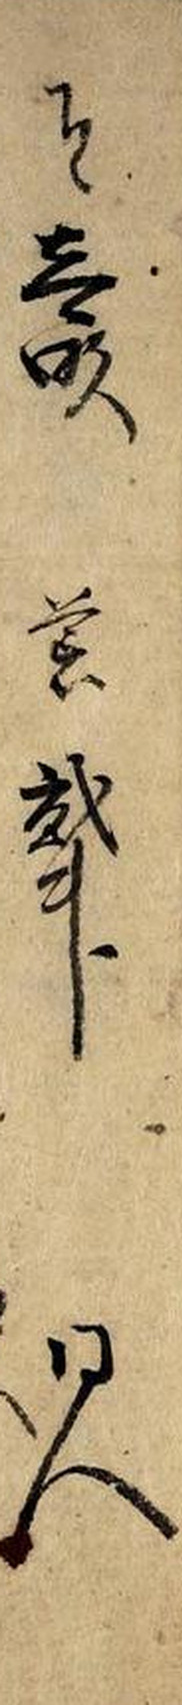下々壱畝荒弐升同人
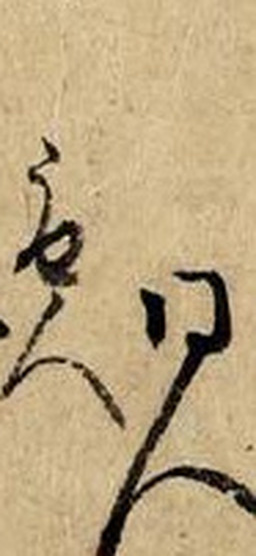うせ人
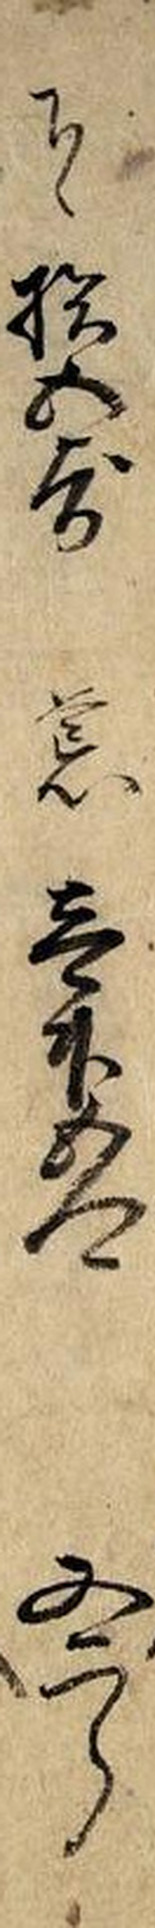下々拾五歩荒壱升五合又二郎
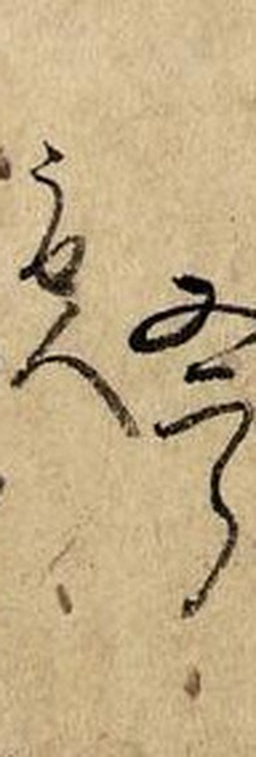うせ人
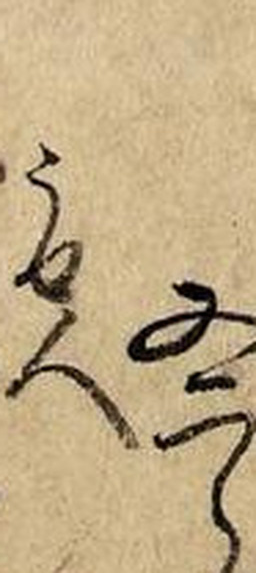うせ人
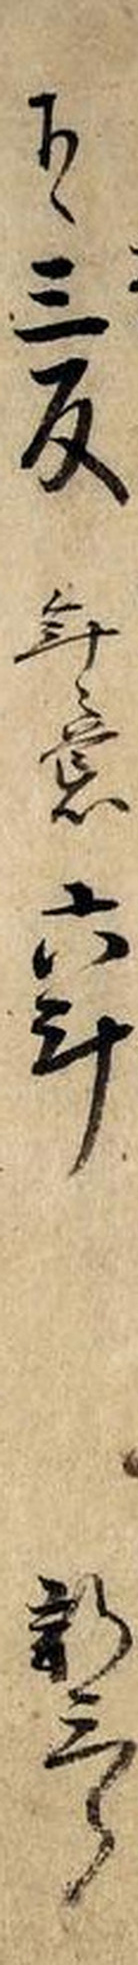下々三反年々荒六斗新三郎
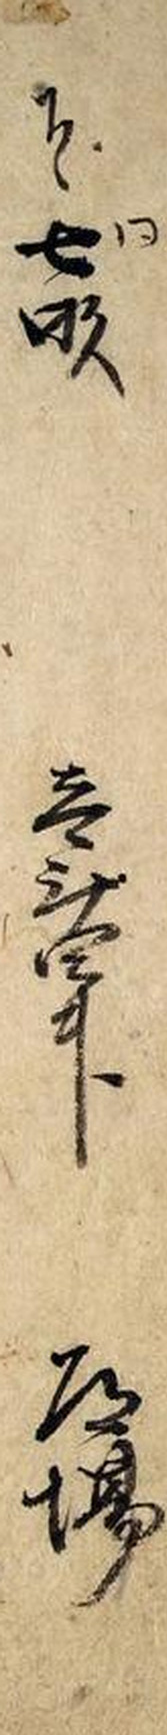下々七畝壱斗四升道場
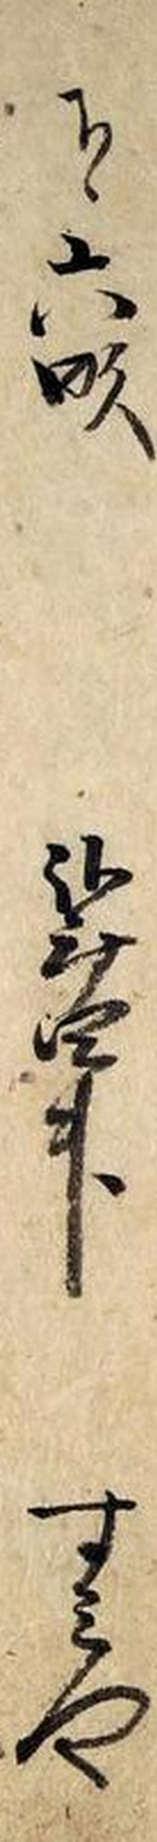下々六畝弐斗四升すみや
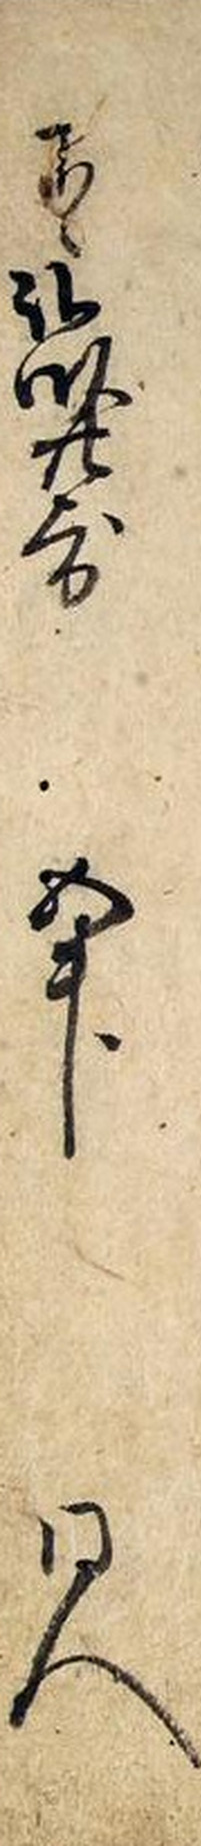下々弐畝廿歩五升同人

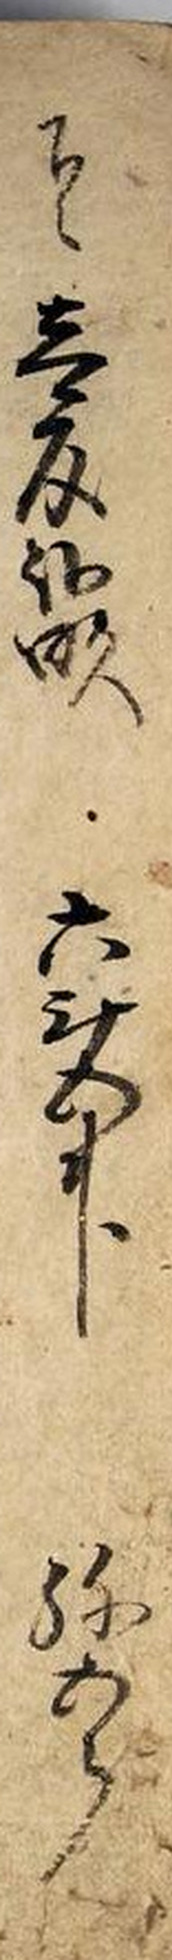下々壱反弐畝六斗五升弥五郎
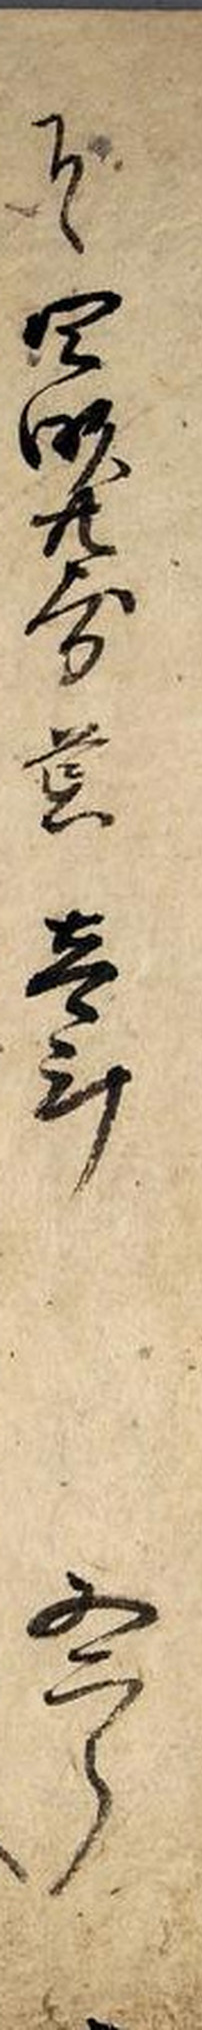下々四畝廿歩荒壱斗又二郎
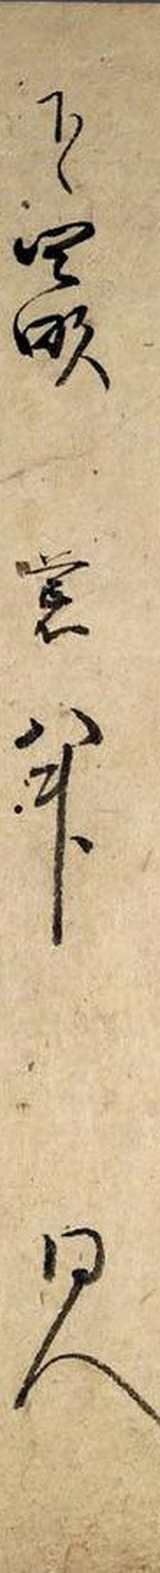下々四畝荒八升同人
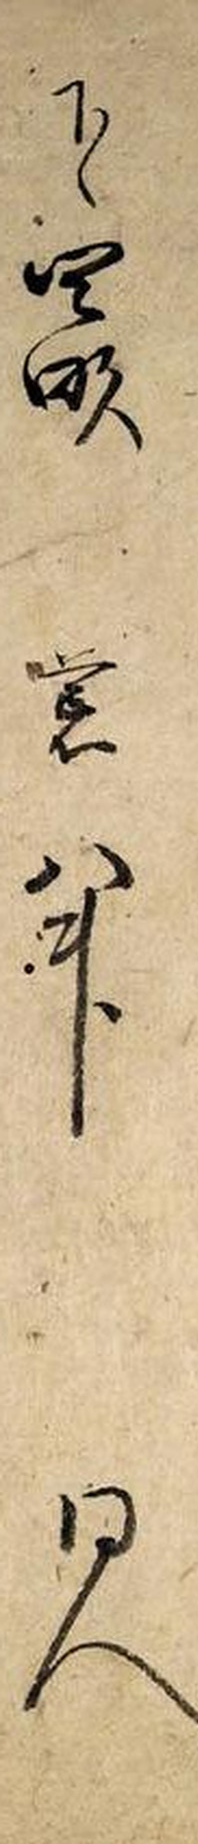下々四畝荒八升同人
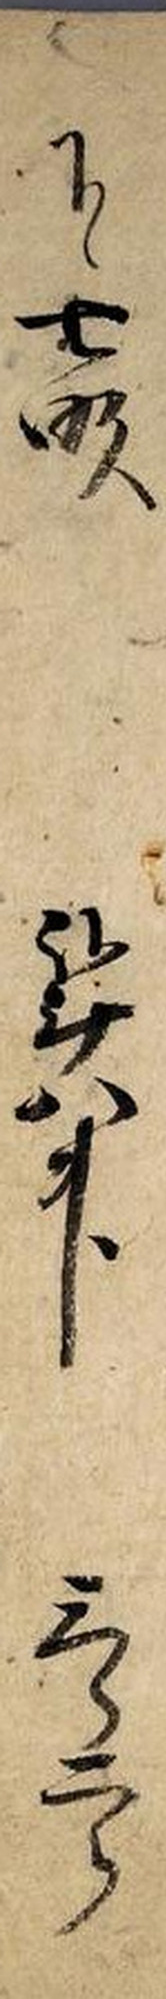下々七畝弐斗八升三郎二郎
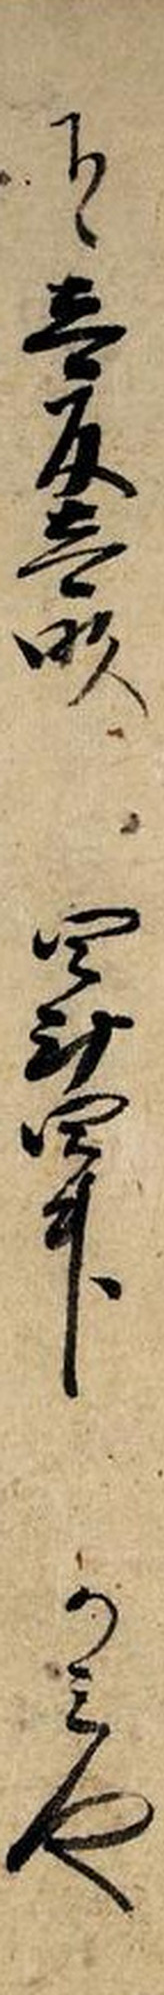下々壱反壱畝四斗四升かみや
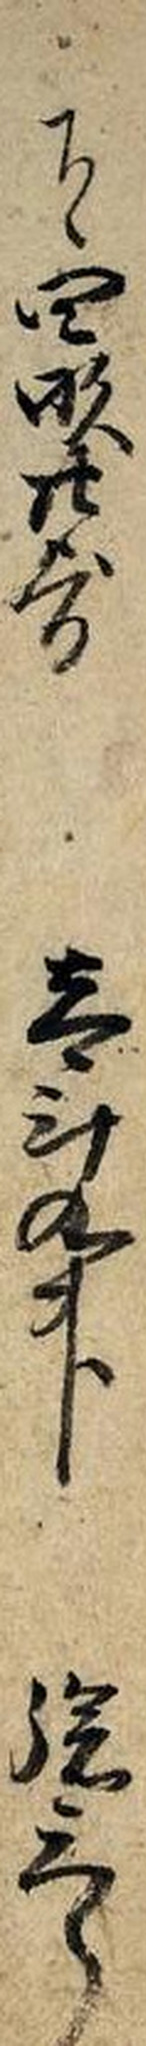下々四畝廿歩壱斗九升孫三郎
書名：若州三方郡之内世久見浦御検地帳（世久見浦検地帳写）
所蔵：福井県文書館 Fukui Prefectural Archives
